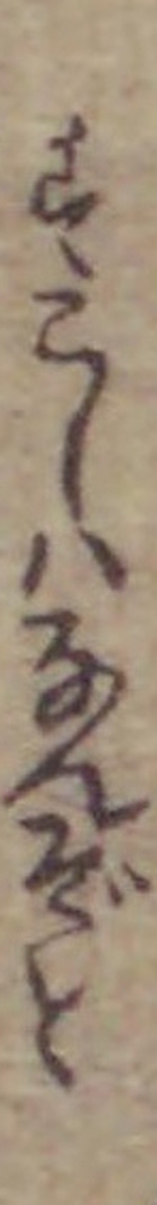すこしはなんぞと
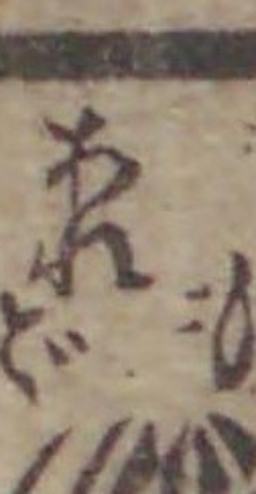あれど
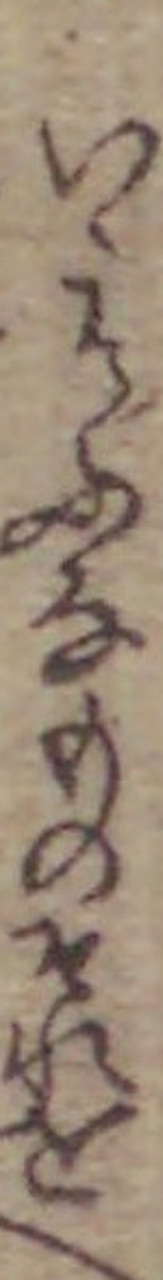いゝそふなものそれを
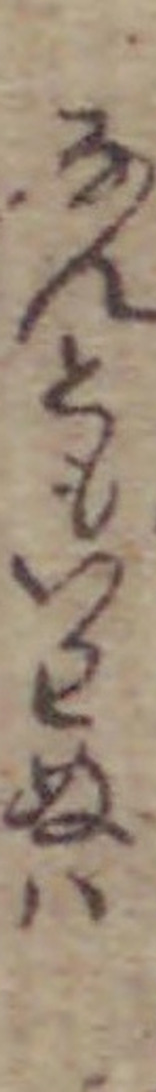なんともいわぬは
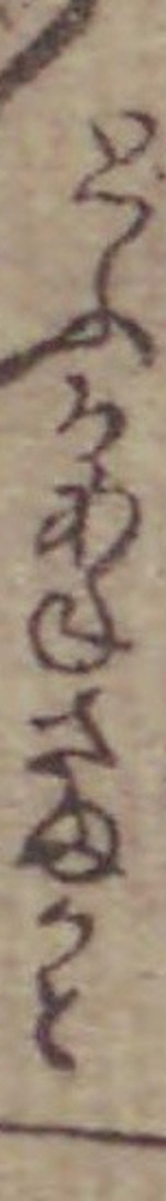どふかあねさまかと
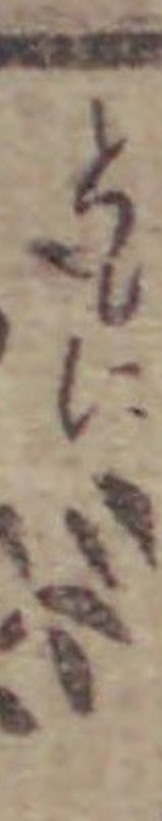ともに
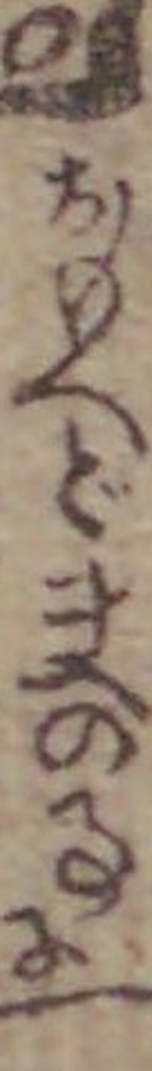おもへど夫の事に
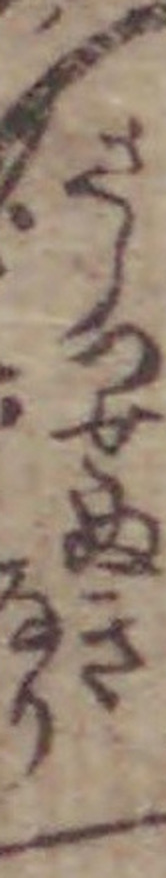さしつせぬき

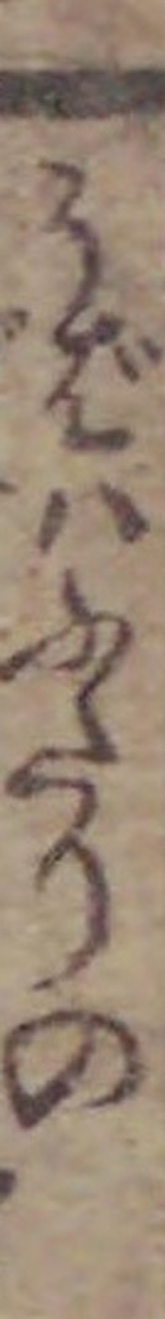うばはふたりの
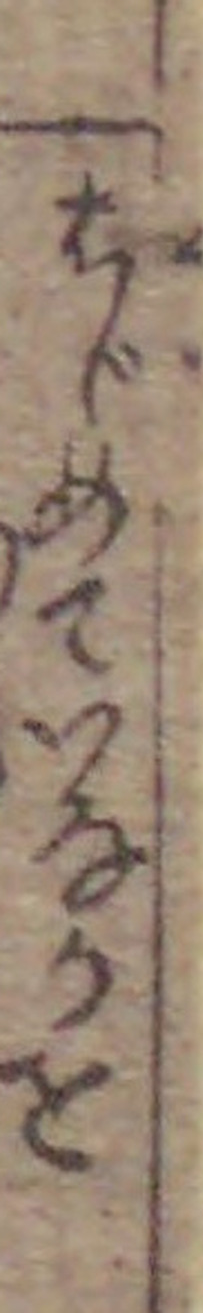はじめていなかを
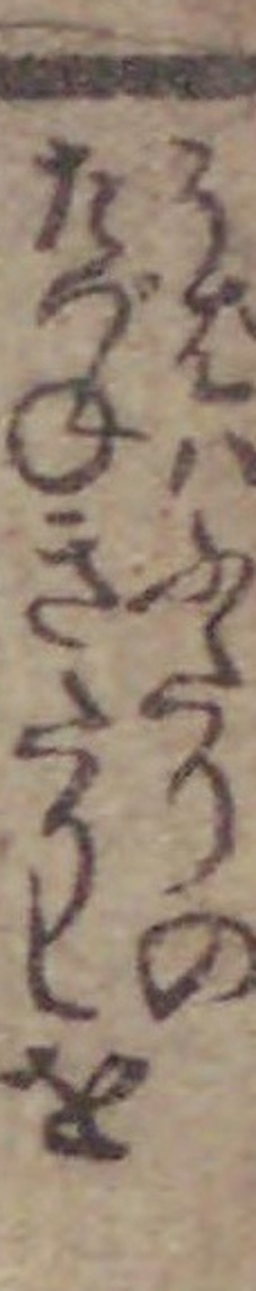たづねきたりしを
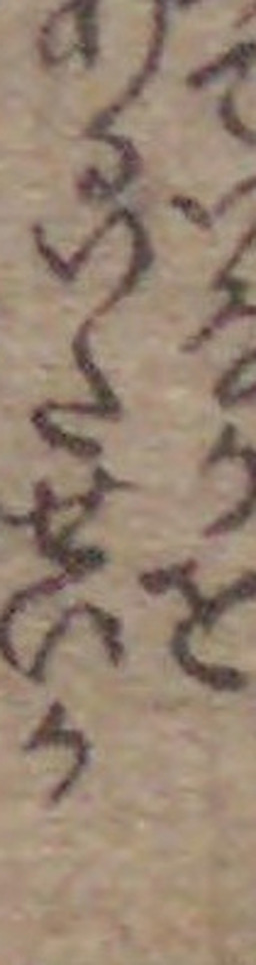あるいたせいか
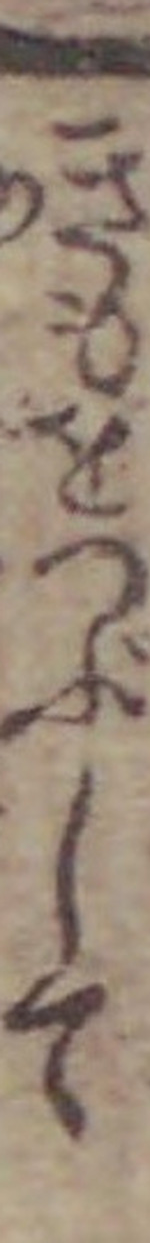きもをつぶして
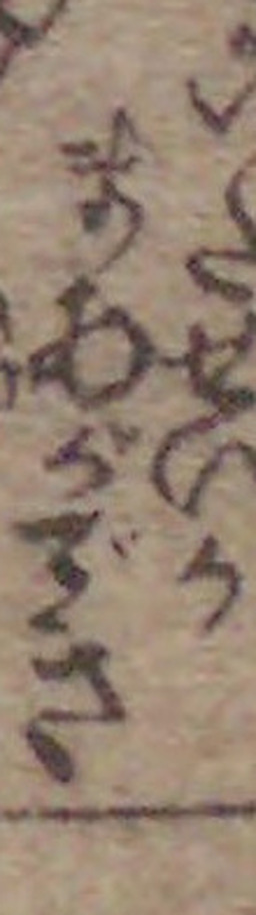まめができ
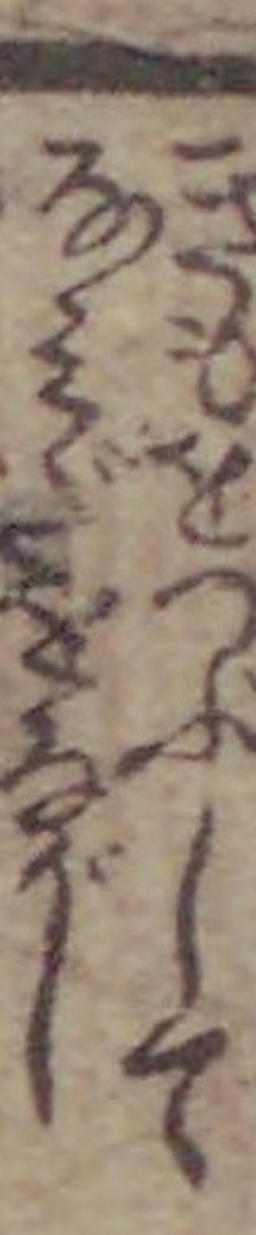なみだをながし
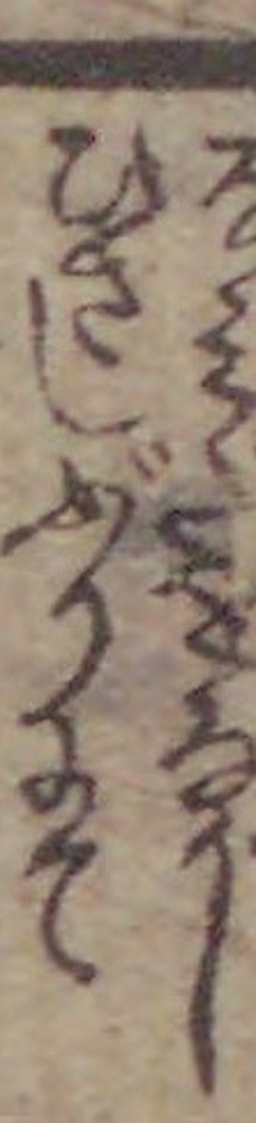ひさしぶりにて
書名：御代の御寶
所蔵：国立国会図書館 National Diet Library, JAPAN
